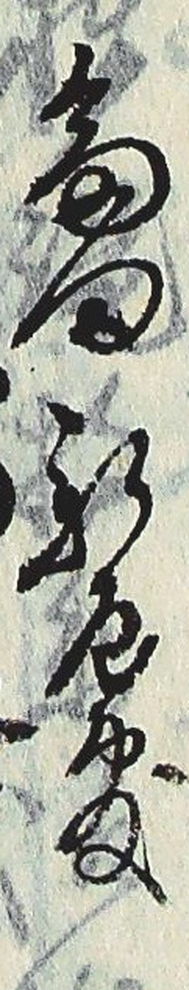高田新屋敷
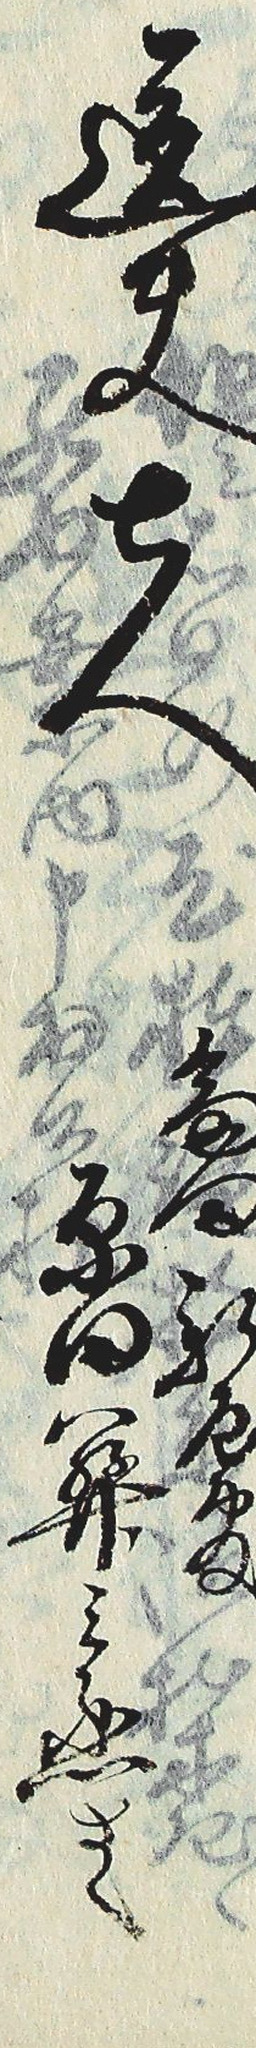送夫七人原田算之丞方へ
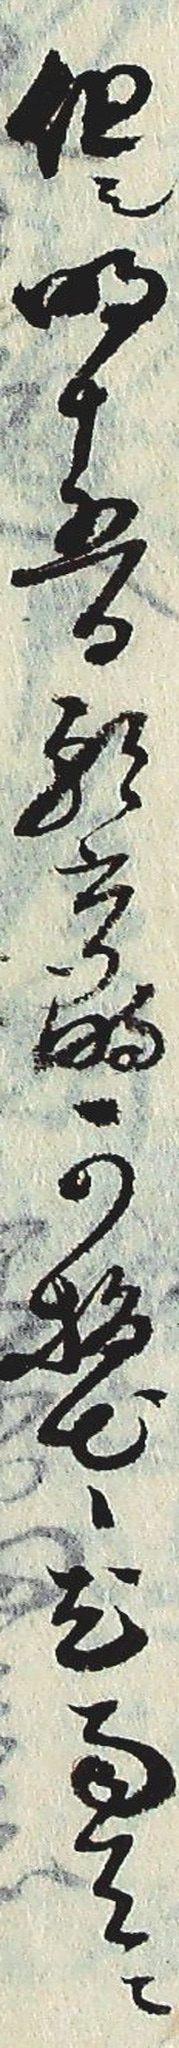但し明十五日朝六つ時可指出候尤雨天に
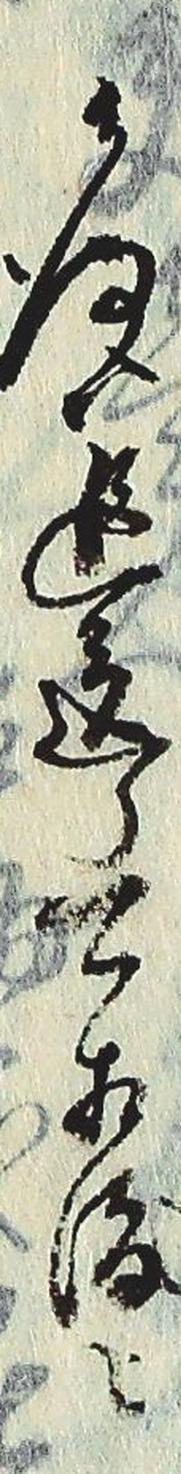候得は追送り可相渡候
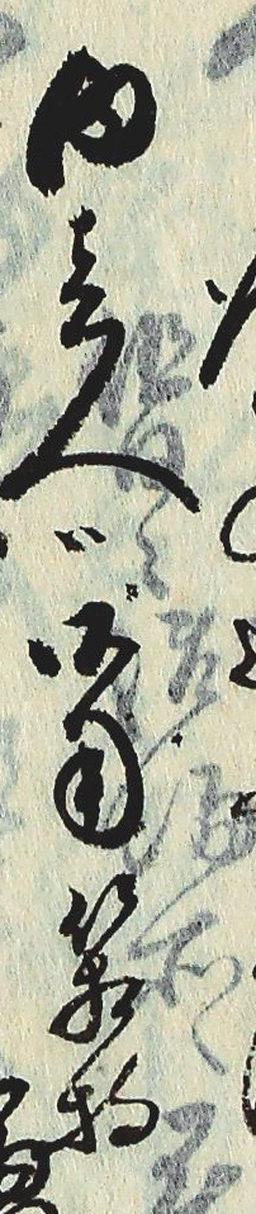内壱人は御用箱持
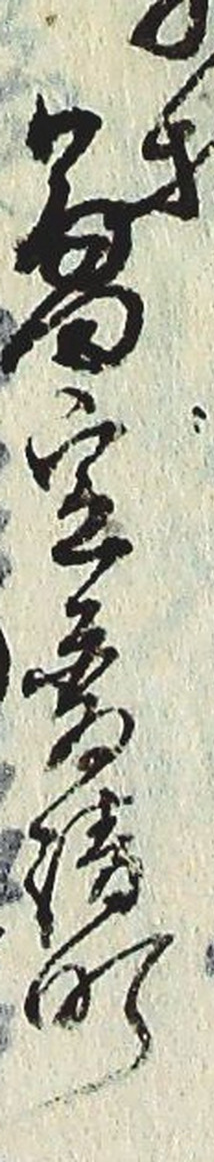冨田定普請町
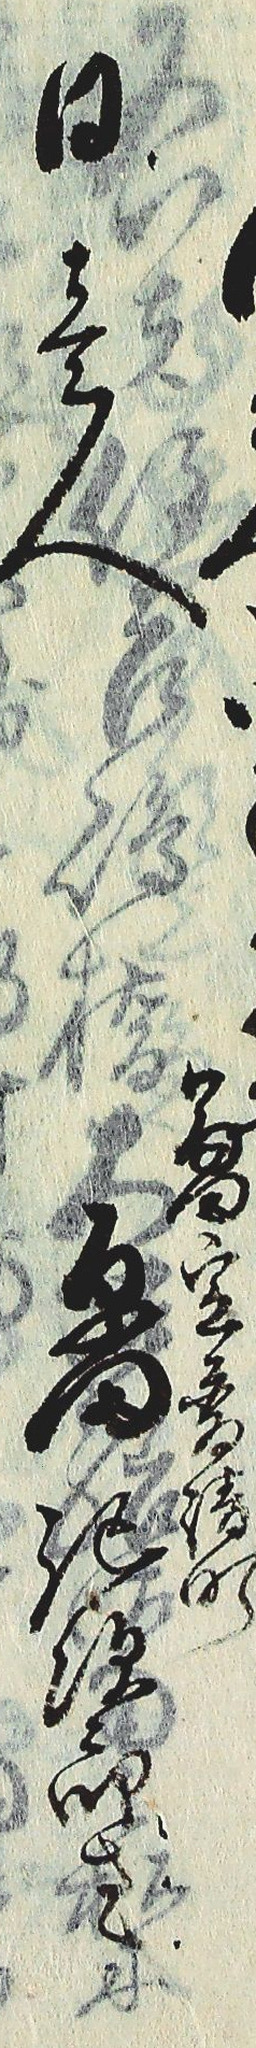同壱人原田紀次郎方へ
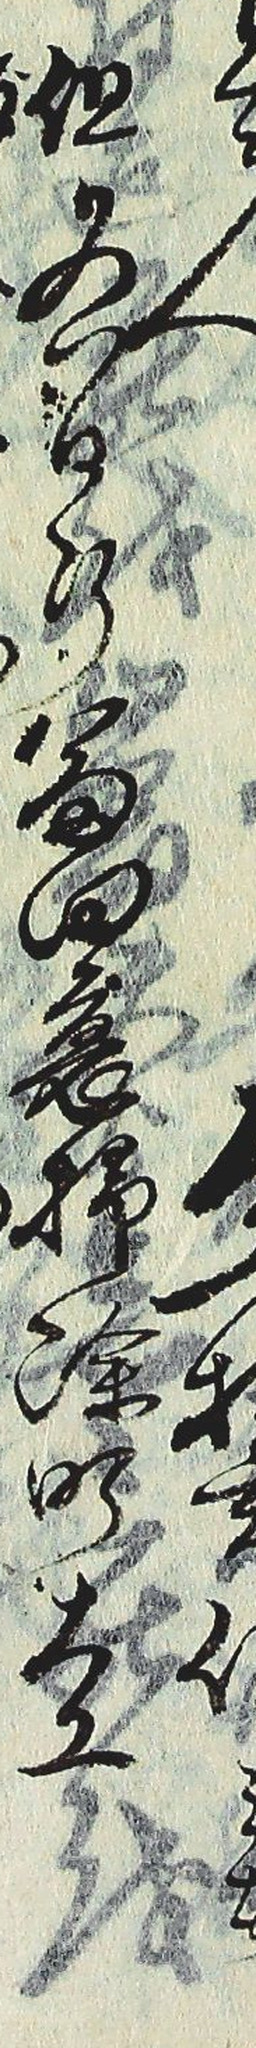但右同断富田裏掃除町大工
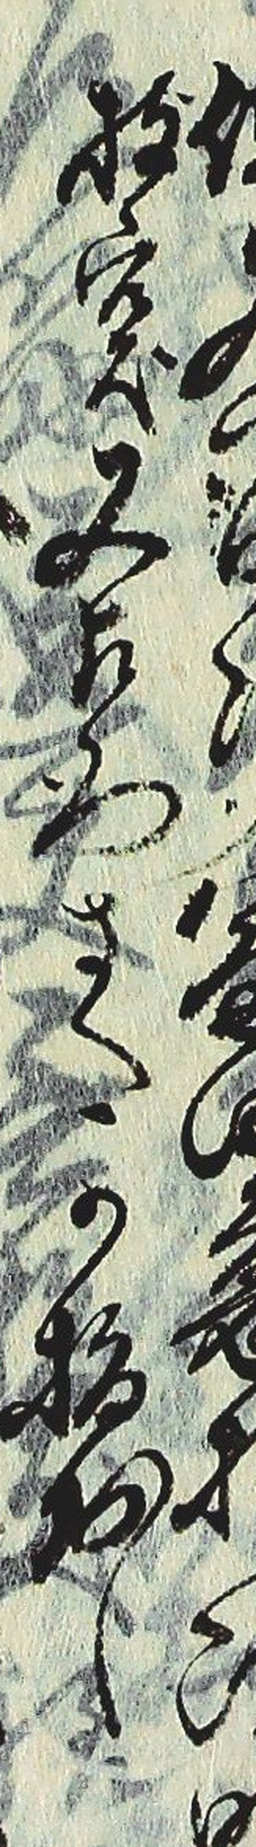杖突又左衛門方へ可指出候
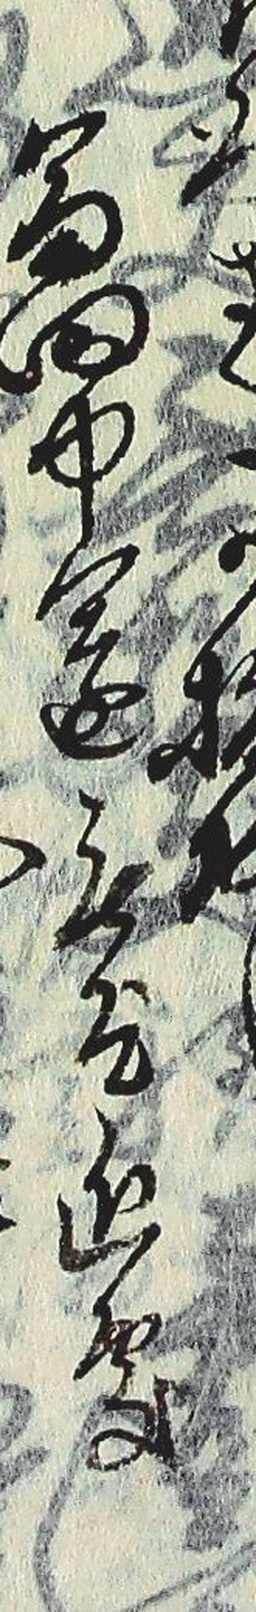冨田中園庄屋近処
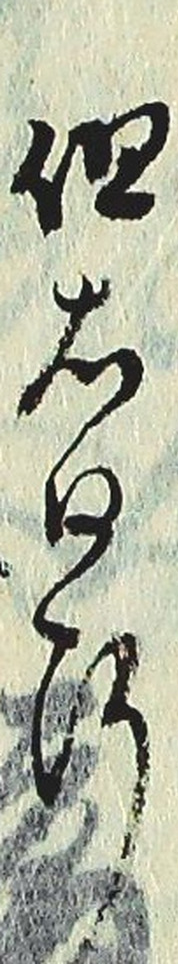但右同断
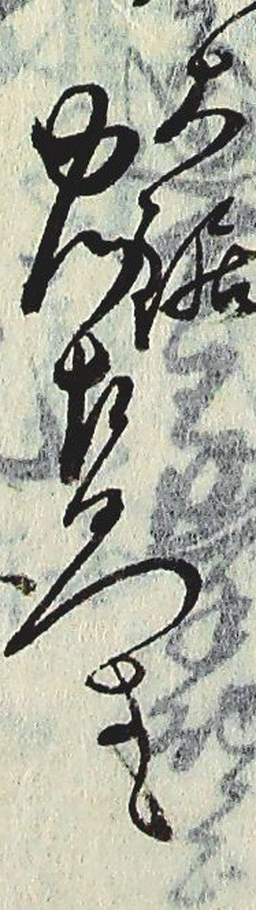又左衛門方へ
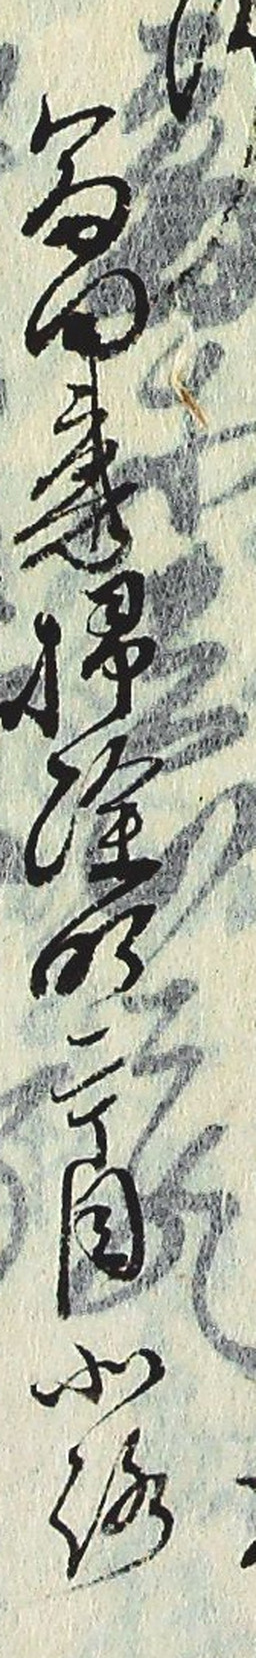冨田裏掃除町二丁目北路
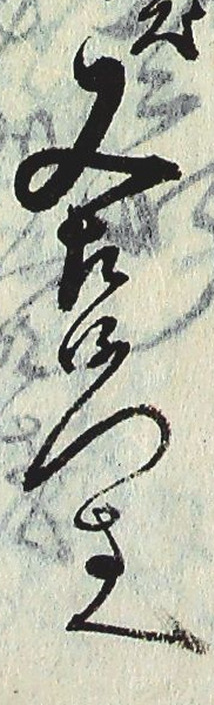又左衛門方へ
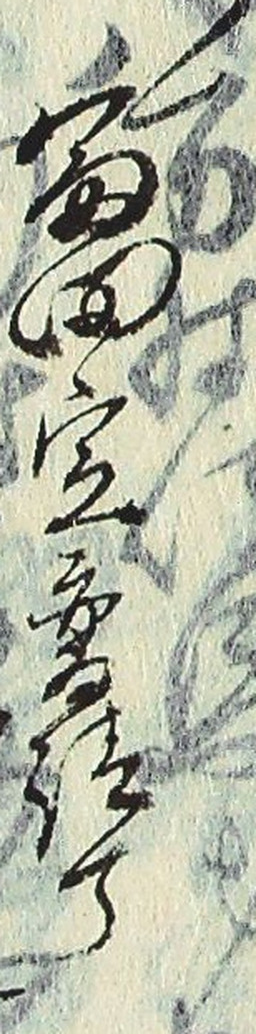冨田定普請丁
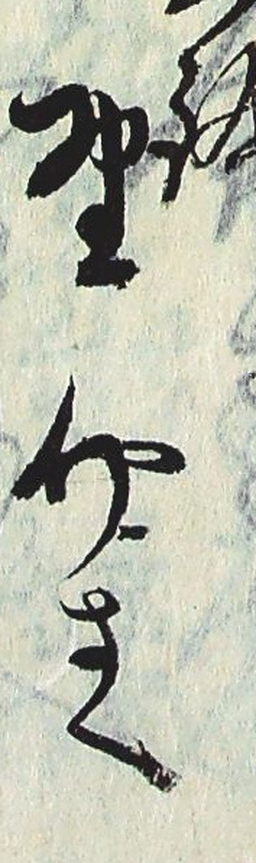野介方へ
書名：名東郡中諸割賦元帳
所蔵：鳴門教育大学 Naruto University of Education
